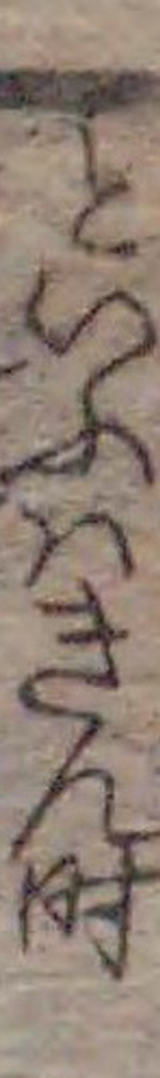といふはきん時
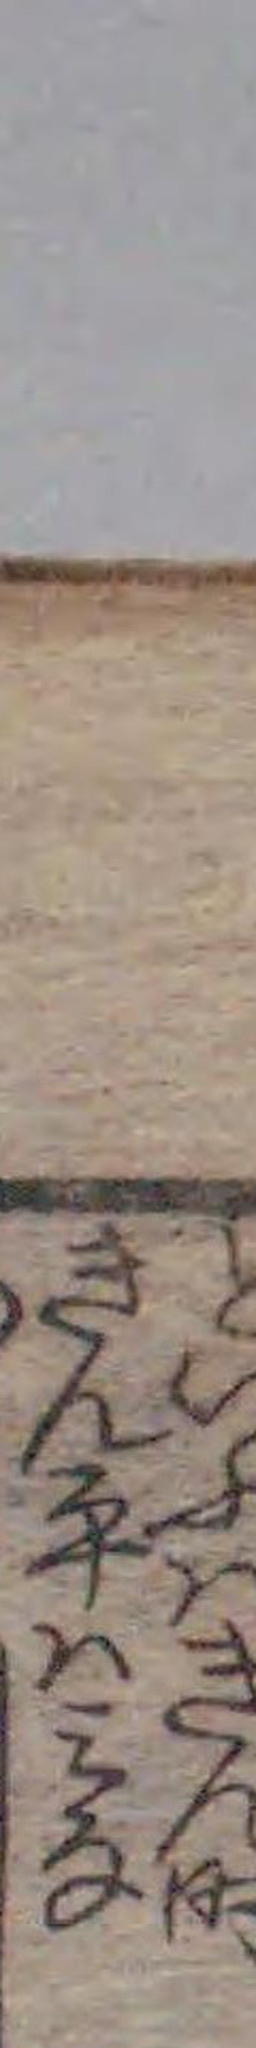きん平はみな
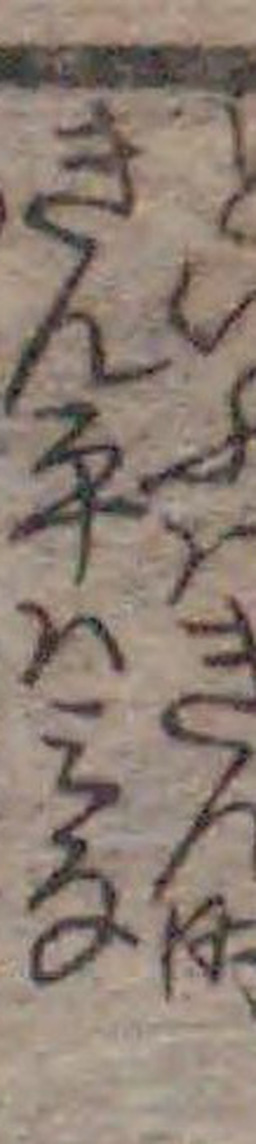きん平はみな
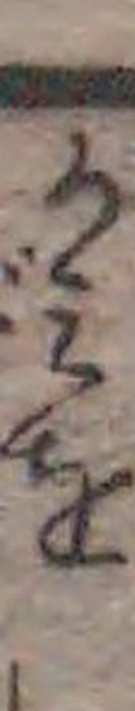かみを
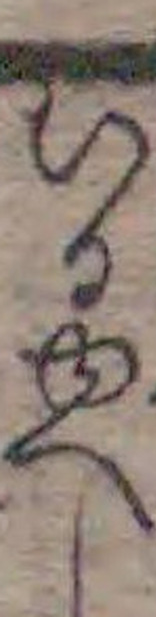いるゆへ
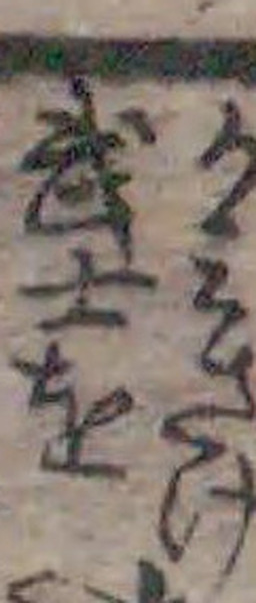武士を
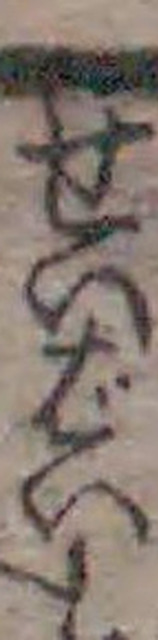せいばい

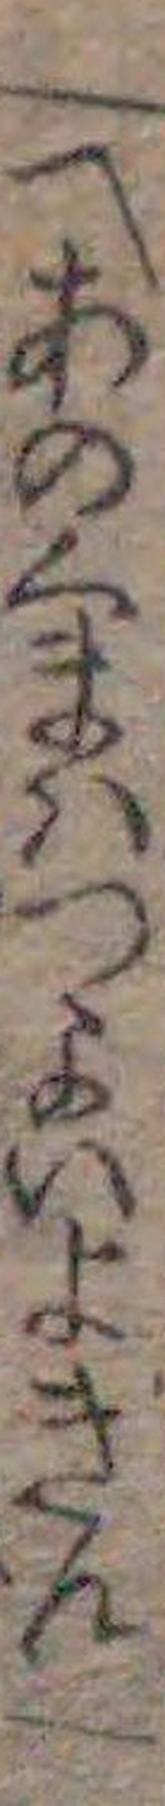〽あのくまはつよいよきん
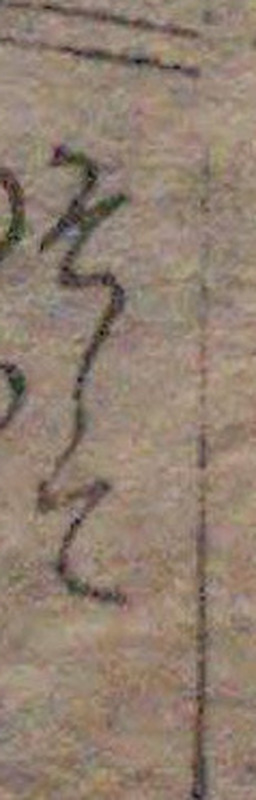そして
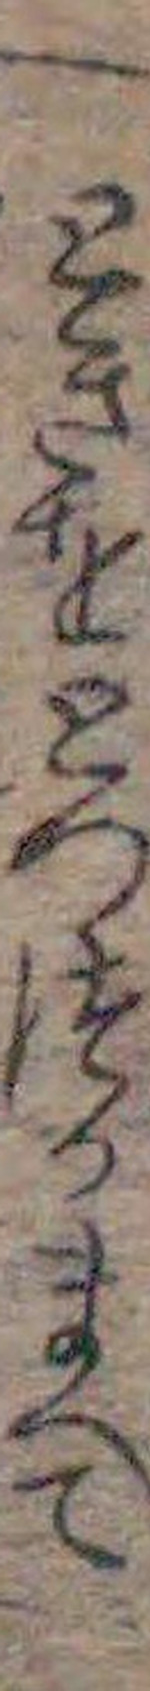ときをとつつかまへて
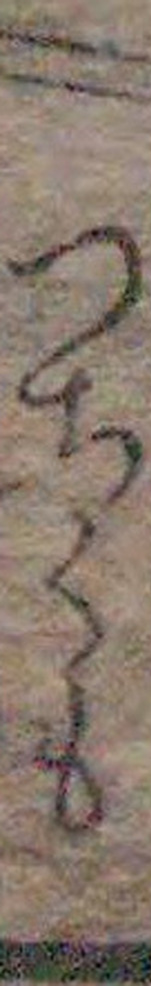つちくも
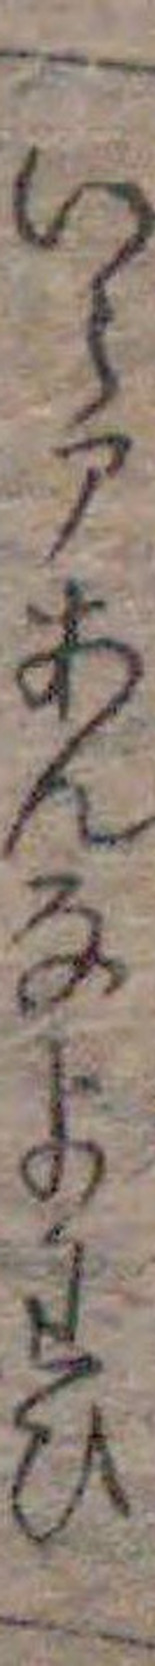いらアあんなよわひ
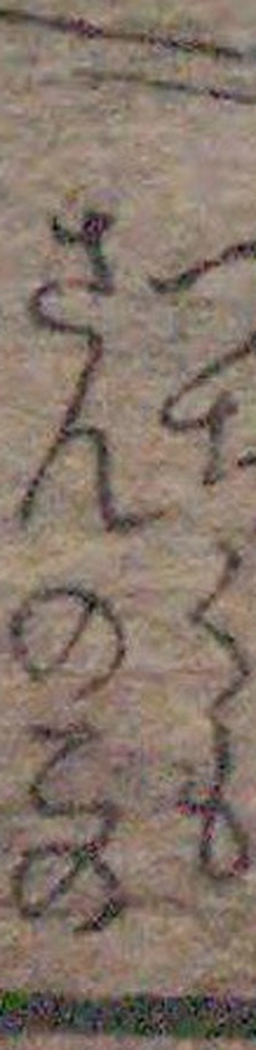さんのこの
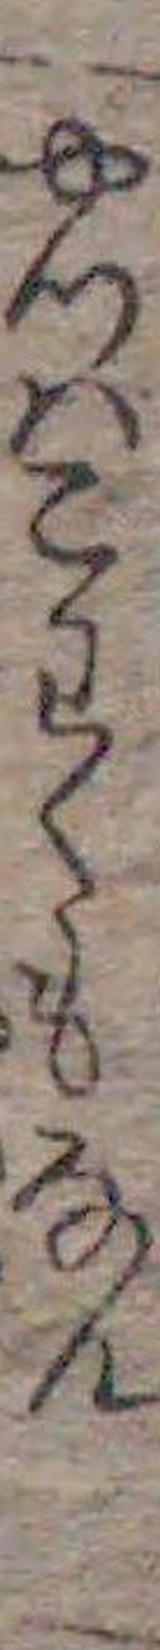やつはこわくもなん
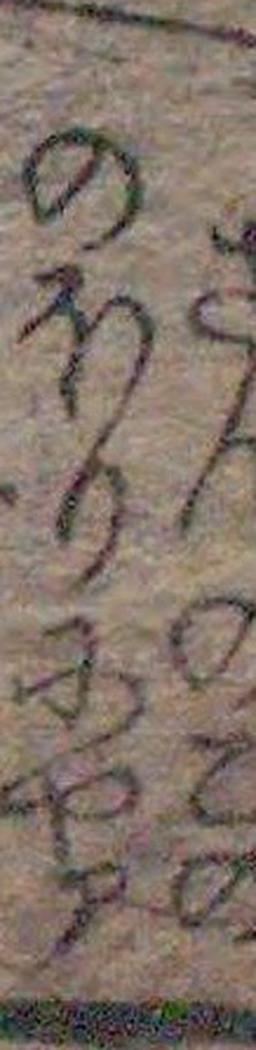のほりにやァ
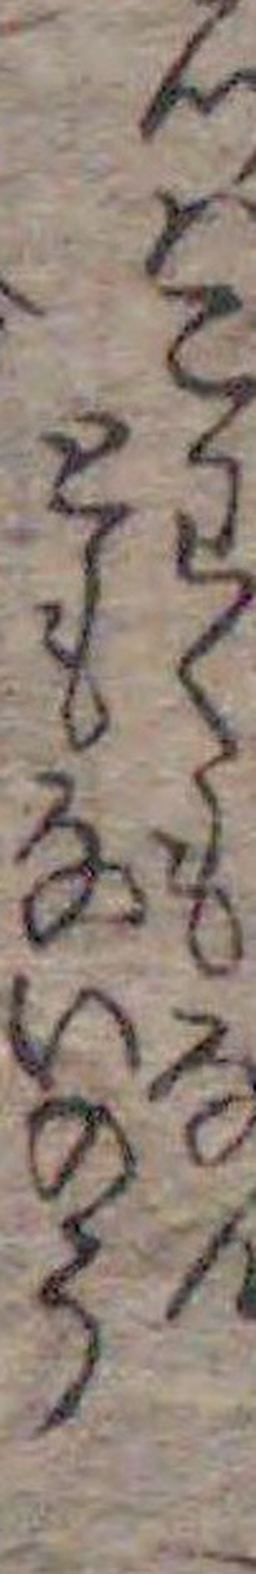ともないのう
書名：年中行状記 : 2巻
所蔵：国立国会図書館 National Diet Library, JAPAN
